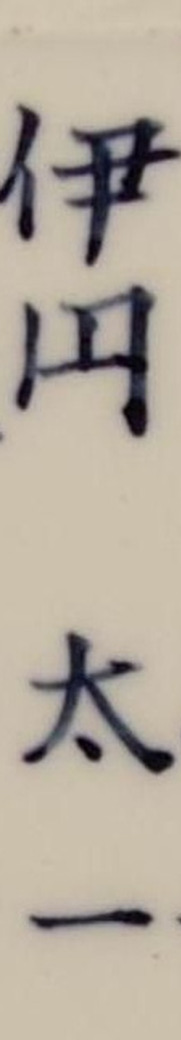伊円太一
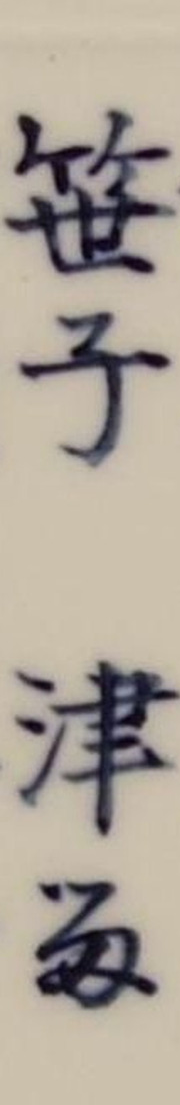笹子津留
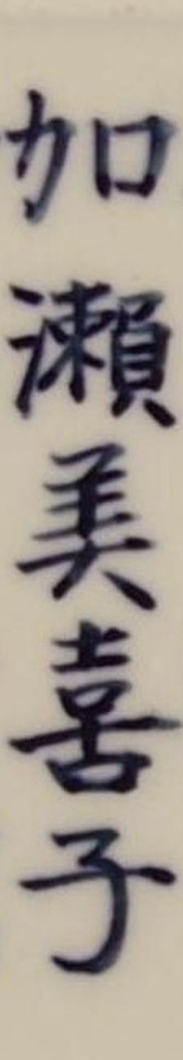加瀬美喜子
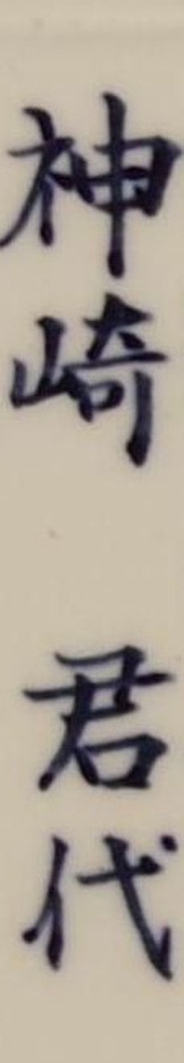神崎君代
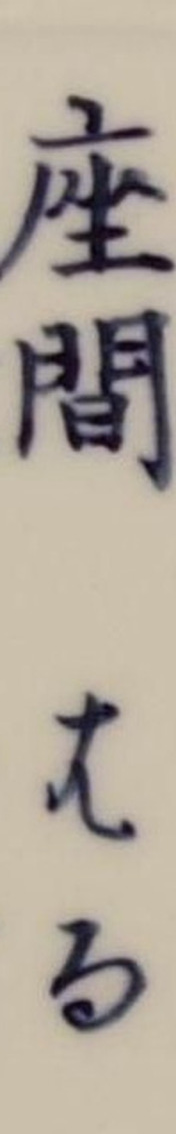座間はる
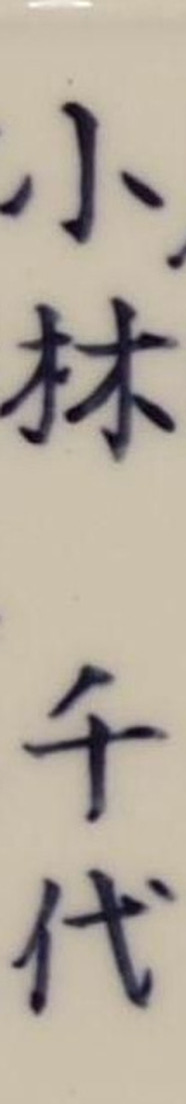小林千代
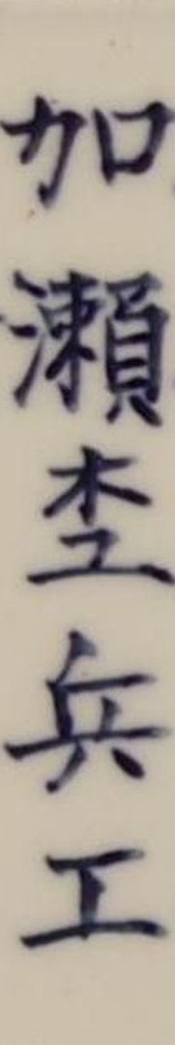加瀬杢兵エ
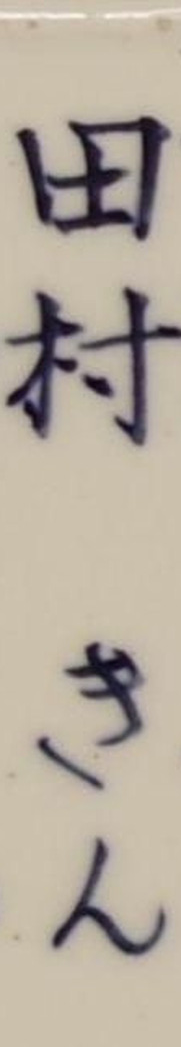田村きん
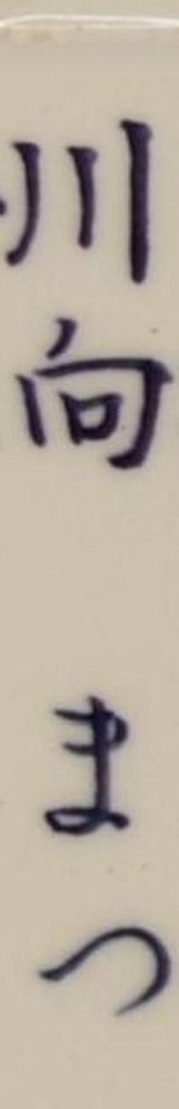川向まつ

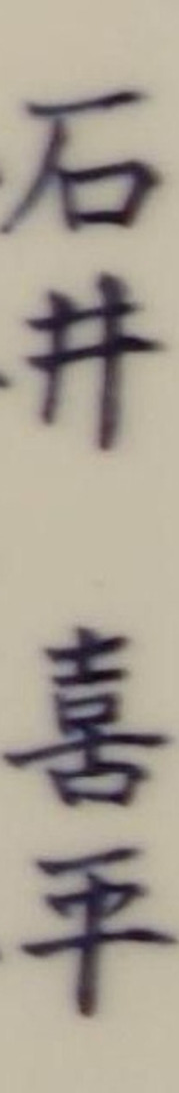石井喜平
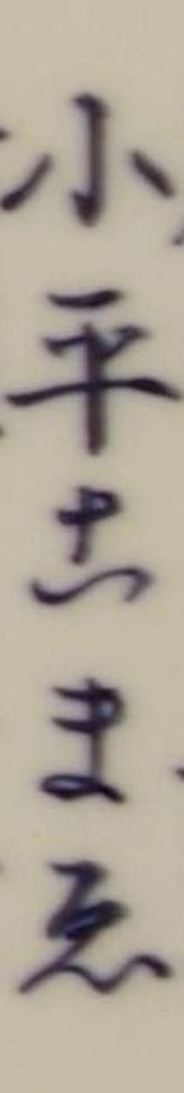小平こまゑ
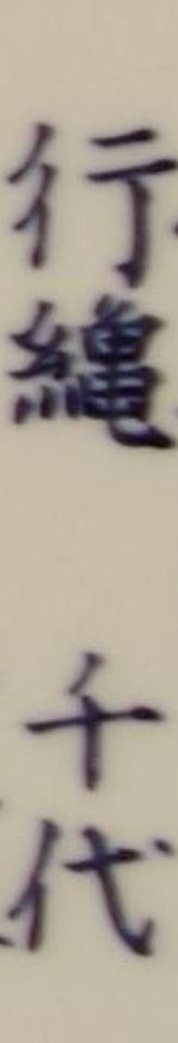行縄千代
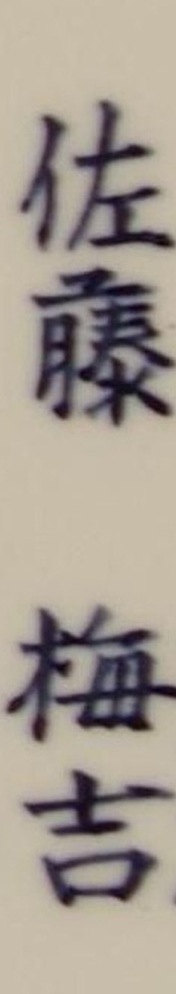佐藤梅吉
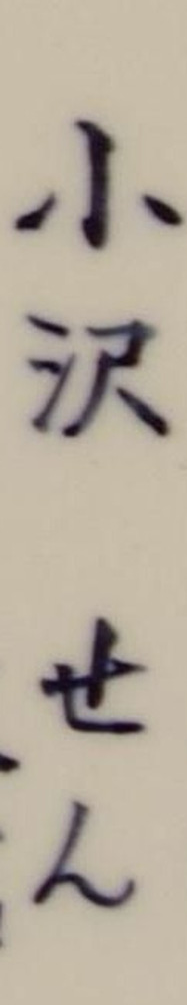小沢せん
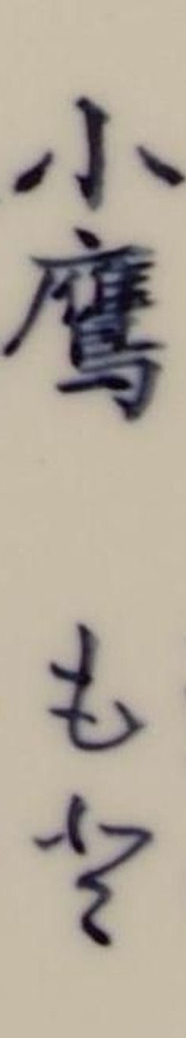小鷹もと
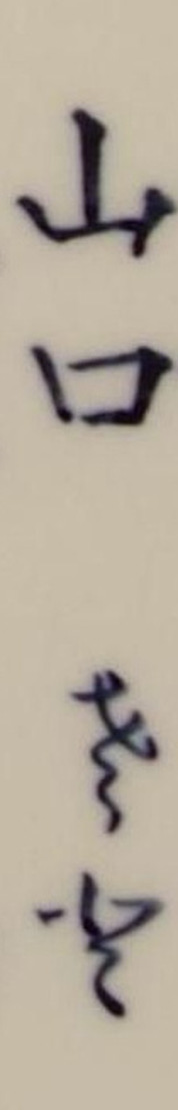山口さと
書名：E~L
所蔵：高野山金剛峯寺
